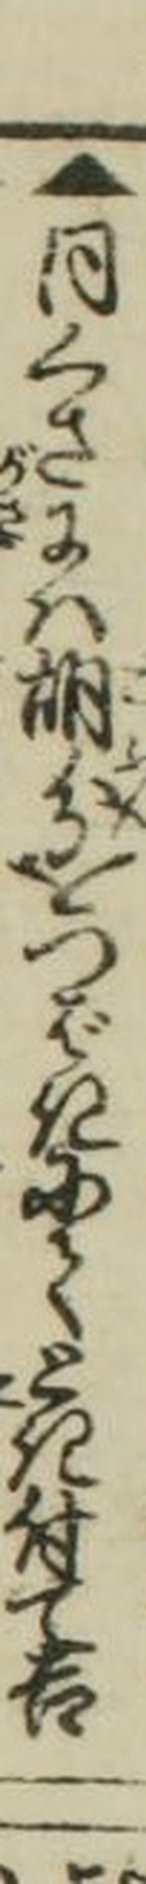▲同くさには胡分をつばきにてとき付て吉
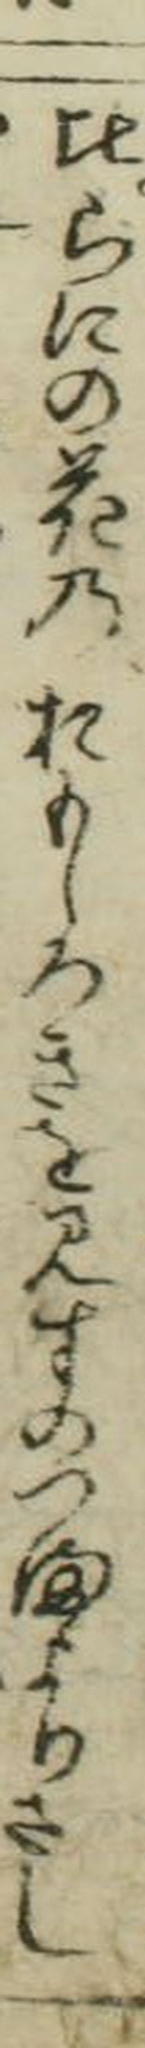比。らにの花のおもしろきをみすのつまよりさし
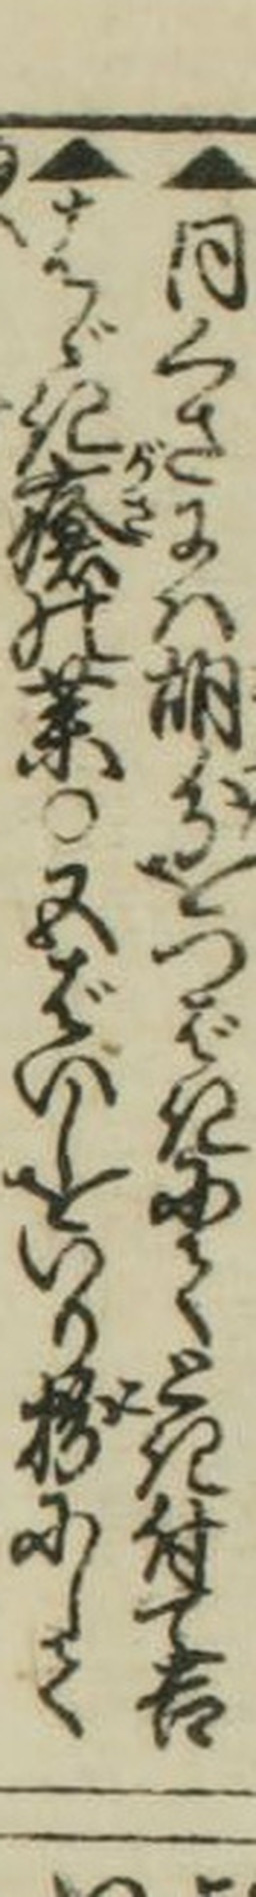▲はゞき瘡の薬◯五ばいしをいり粉にして
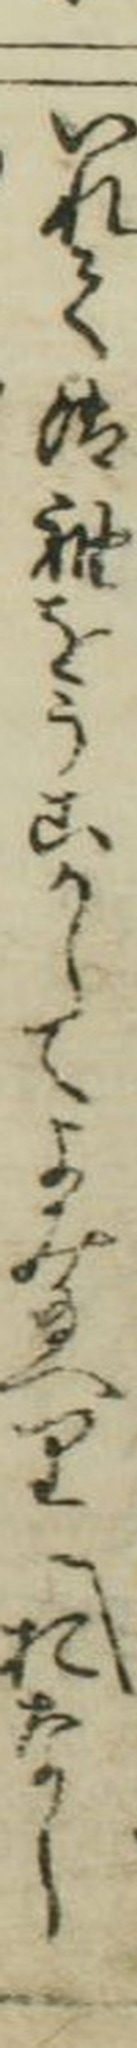いれて御袖をうこかしてよみ給へり〽おなし
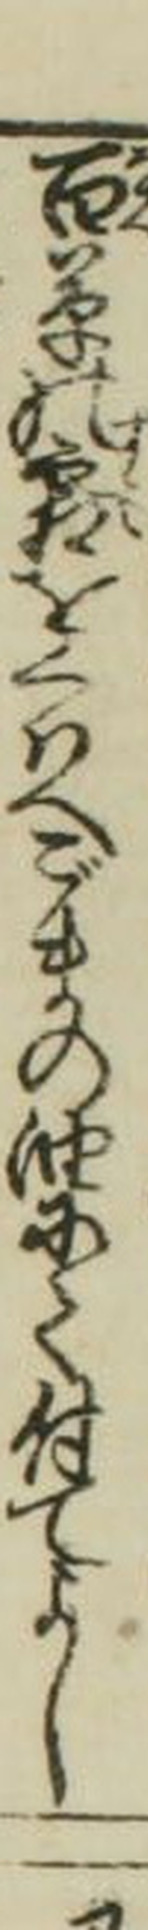百草の霜をくはへごまの油にて付てよし
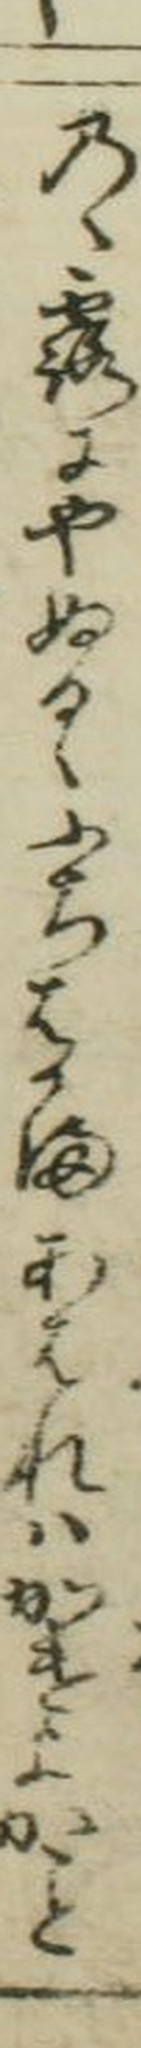のゝ露にやぬるゝふちはかまあはれはかけよかこと
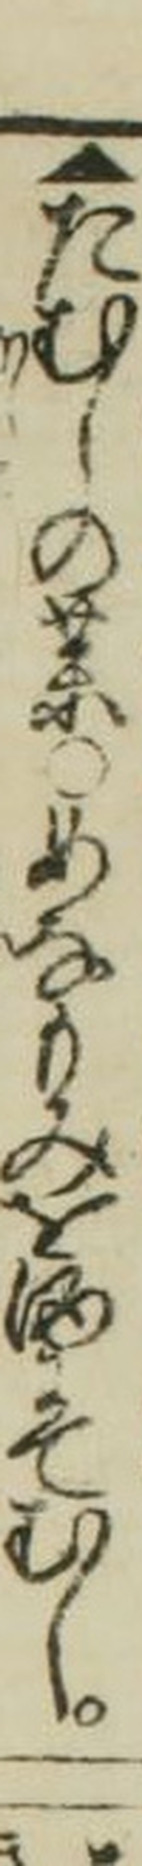▲たむしの薬◯めなもみを酒にてむし。
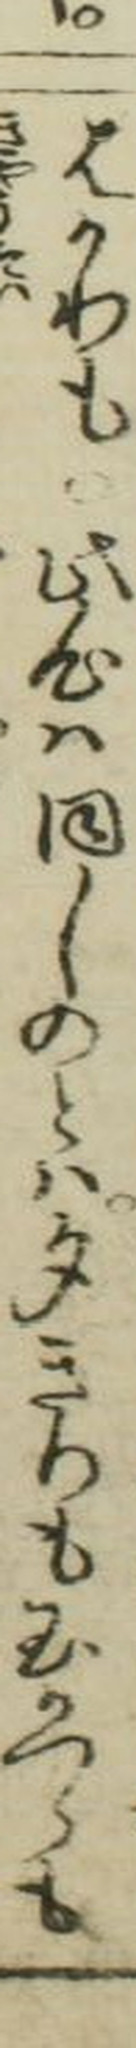はかりも◯此心は同しのとは。夕きりも玉かつらも
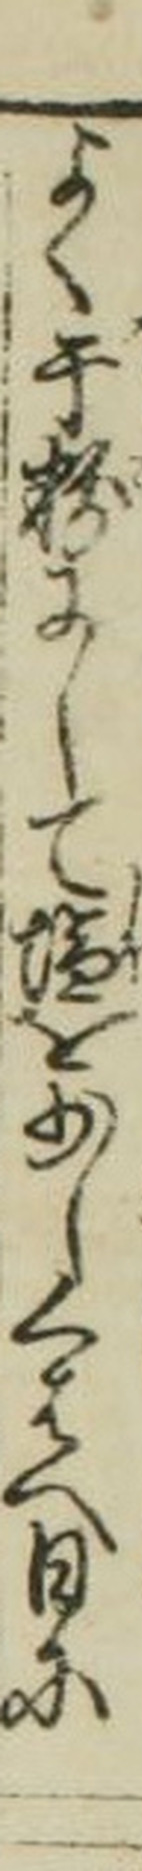よく干粉にして塩を少しくはへ日に
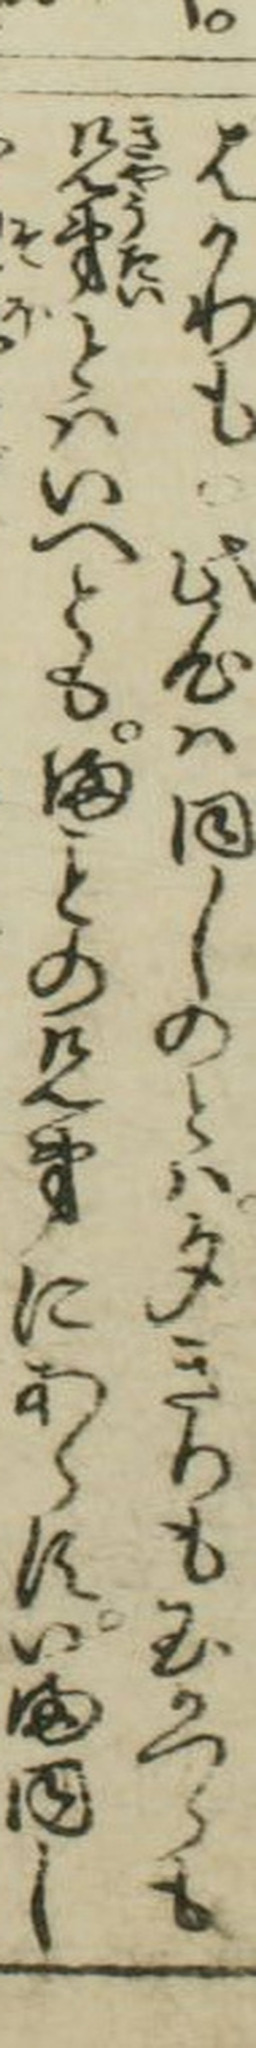兄弟とはいへとも。まことの兄弟にあらす。いま同し
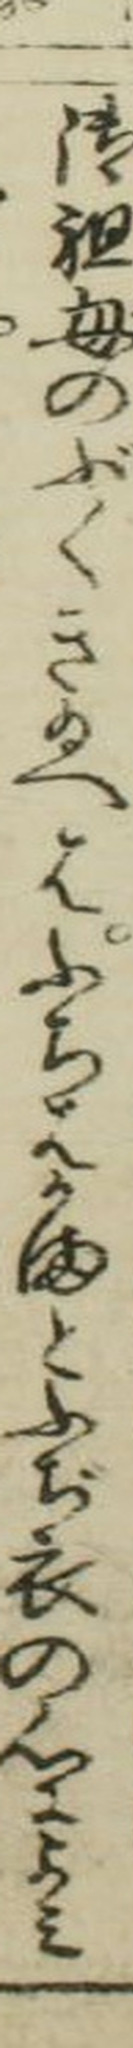御祖母のぶくき給へは。ふちはかまとふぢ衣の心によみ
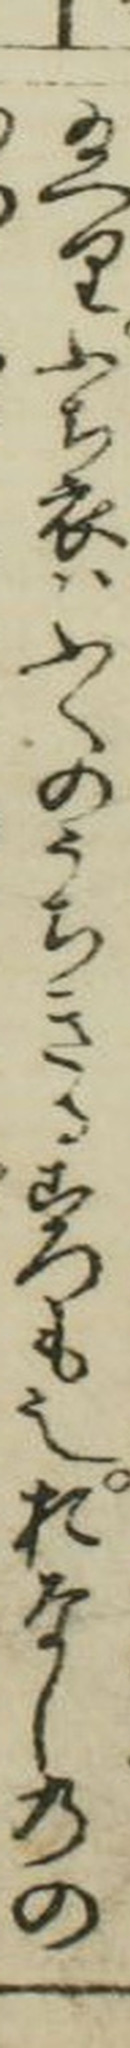給へり。ふち衣はふくのうちきるころも也。おなしのの
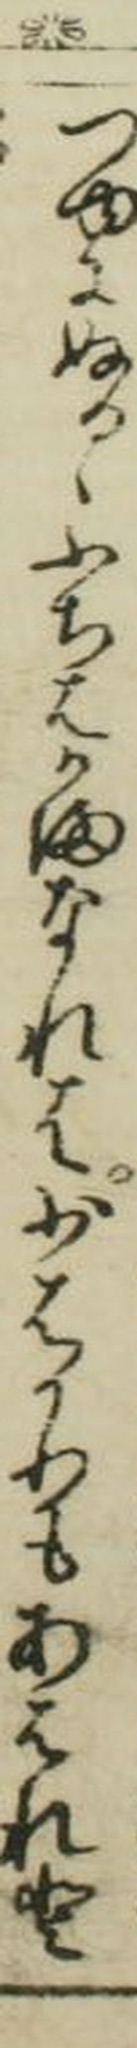つゆにぬるゝふちはかまならは。少はかりもあはれと
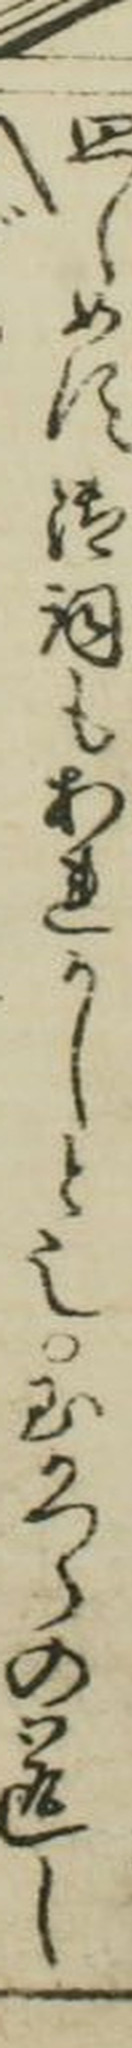思しめす御詞もあれかしと也◯玉かつらの御返し
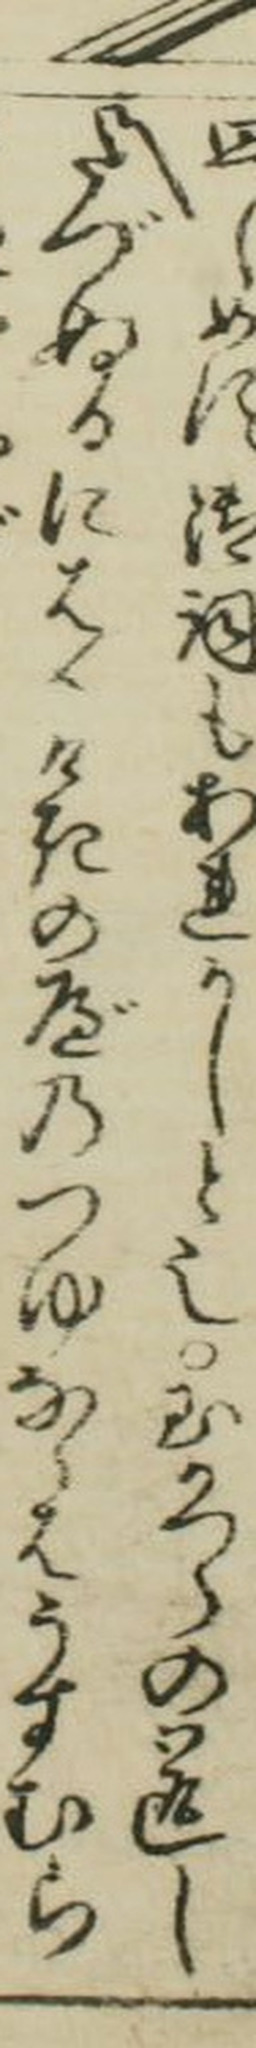〽たづぬるにはるけきのべのつゆならはうすむら
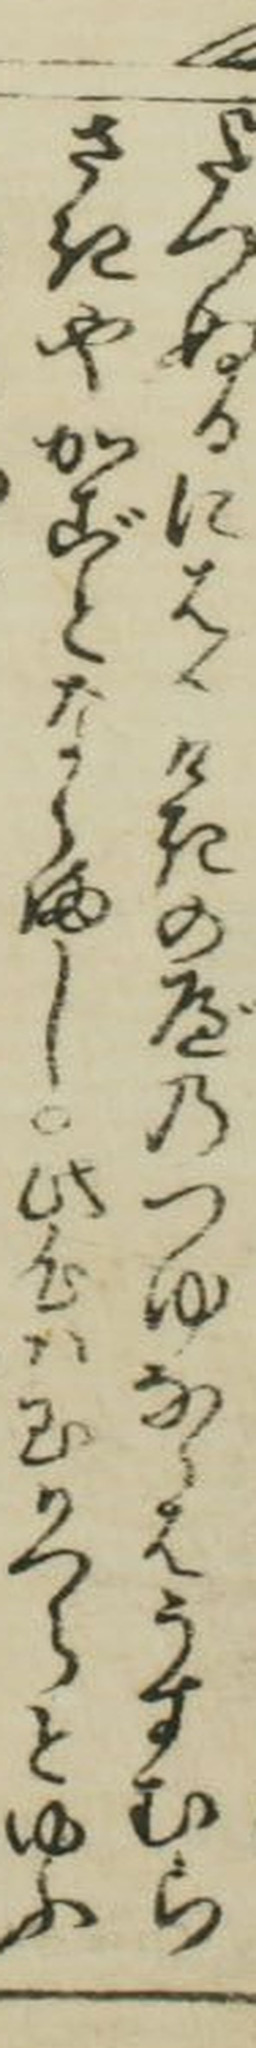さきやかごとならまし◯此心は玉かつらとゆふ
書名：女源氏教訓鑑
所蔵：東京学芸大学附属図書館
